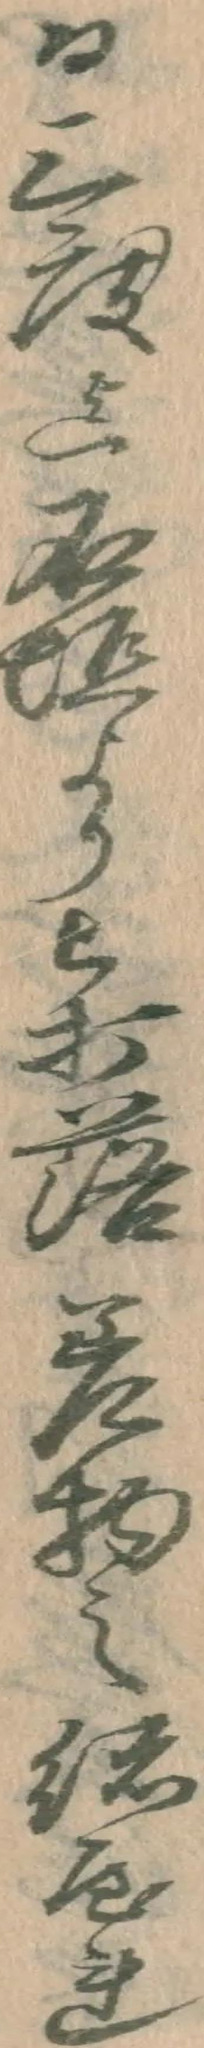日三度迄石垣より被打落差物之緒屋連
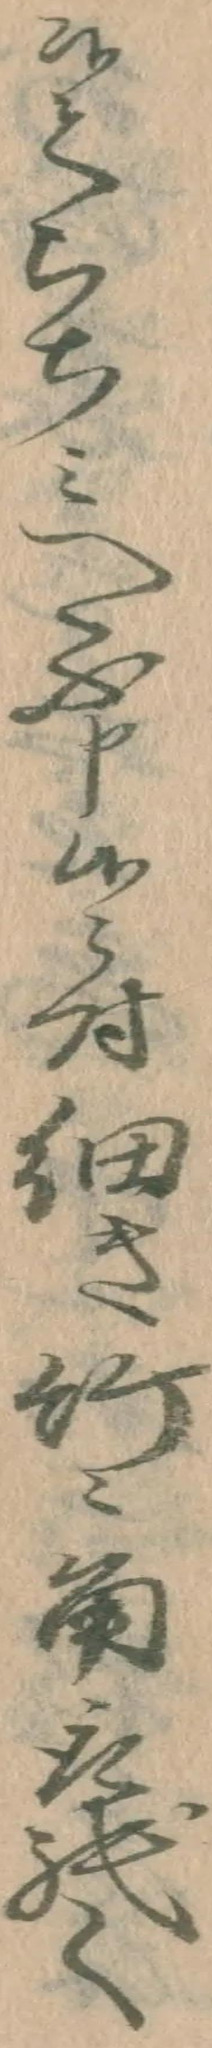候てちちみへふ申候に付細き竹に角取紙く
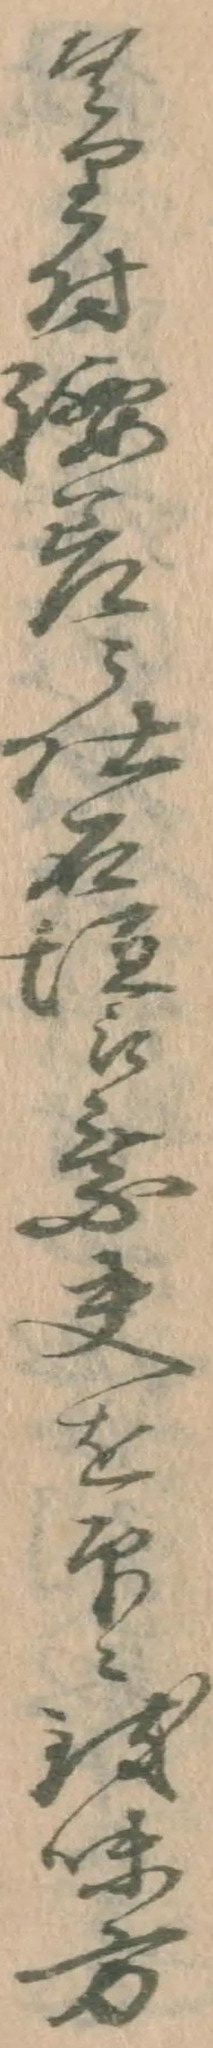具里付腰差に仕石垣江乗夫を印に致味方
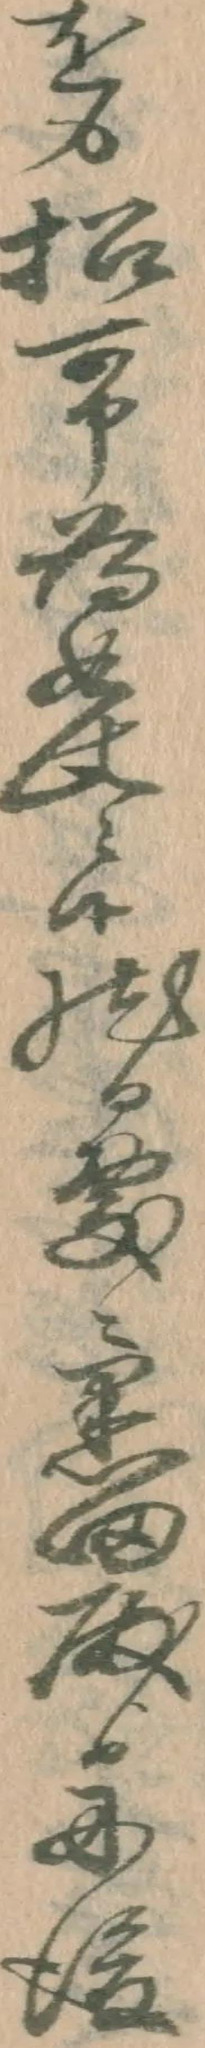をも招可申為如此に候然る處に黒田殿ゟ丹後
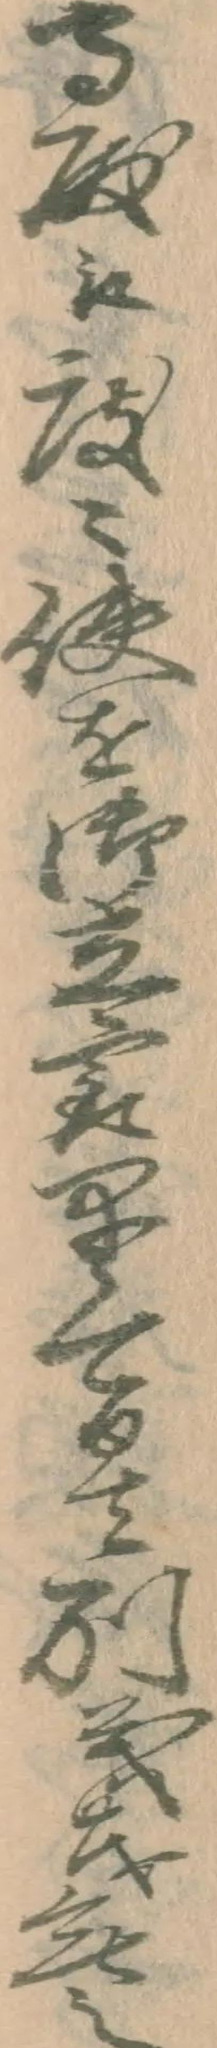守殿江度々使を御立最早今日者別義茂無之
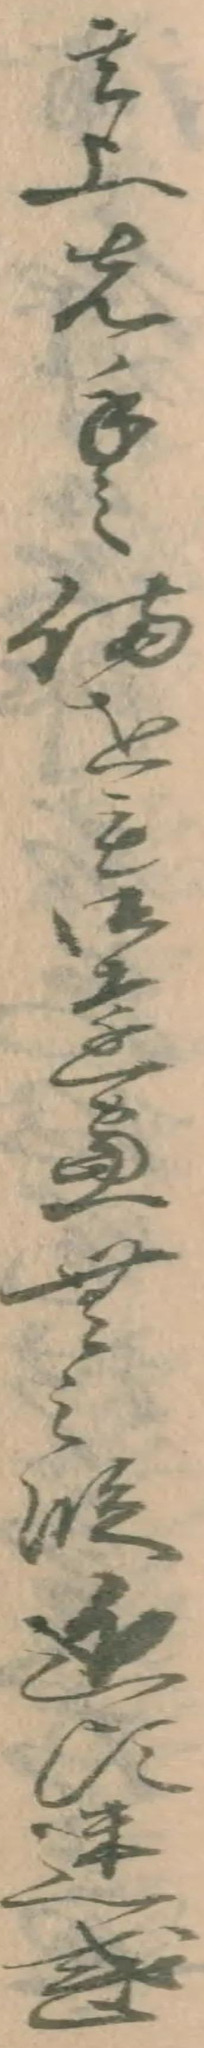其上先手之備をも御遠慮無之段近頃迷惑
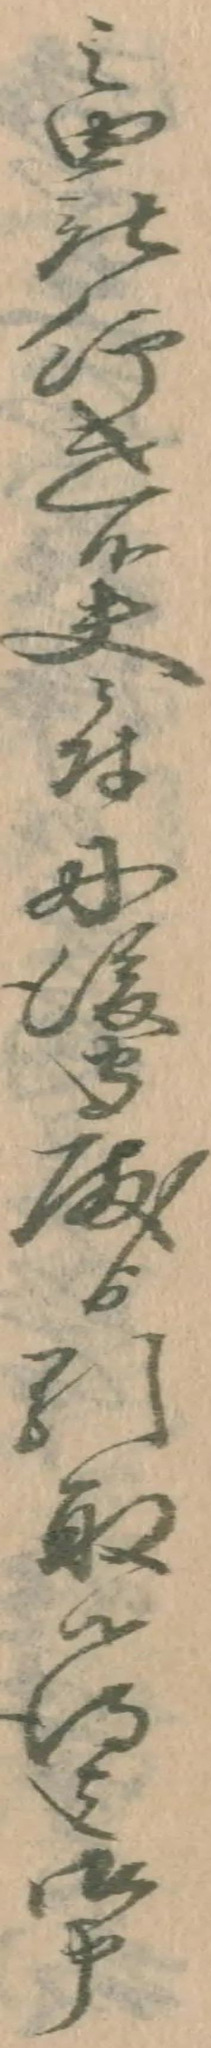之由被仰遣候夫に付丹後守殿ゟ引取候得与御申
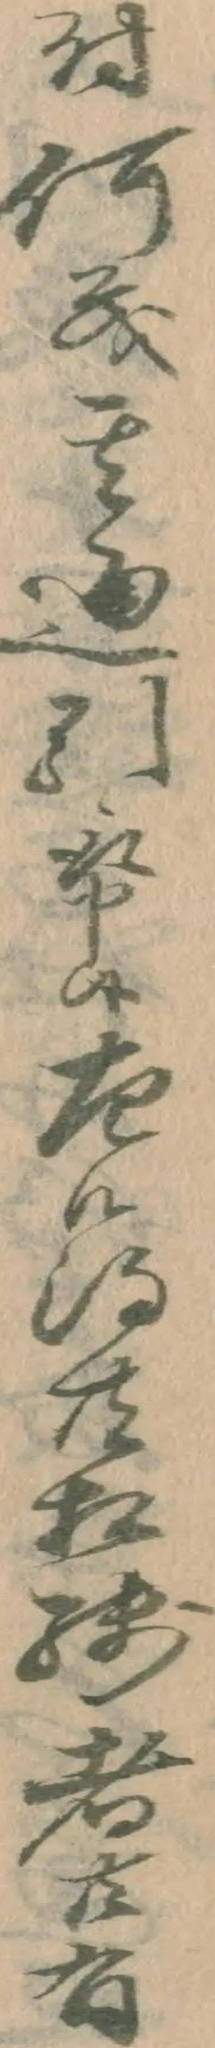付何茂其通引取申候左候得共相居残者共有
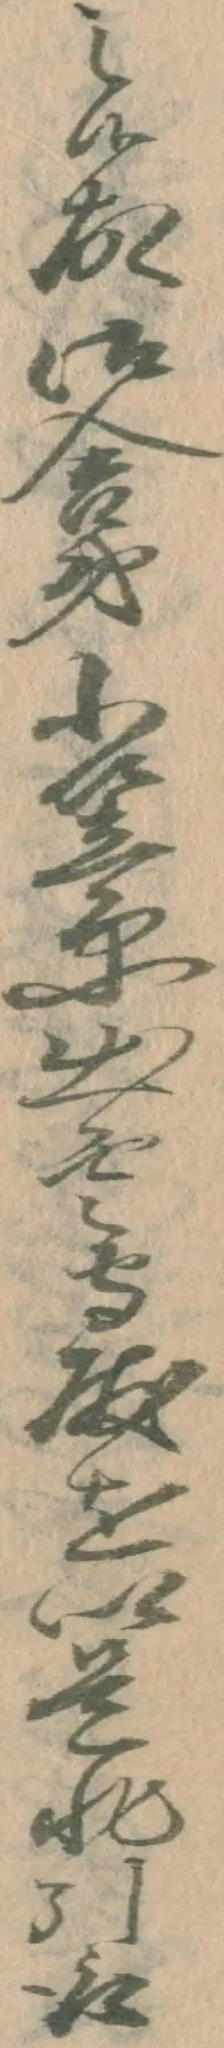之候故御舎弟小笠原出雲守殿を以是非引取
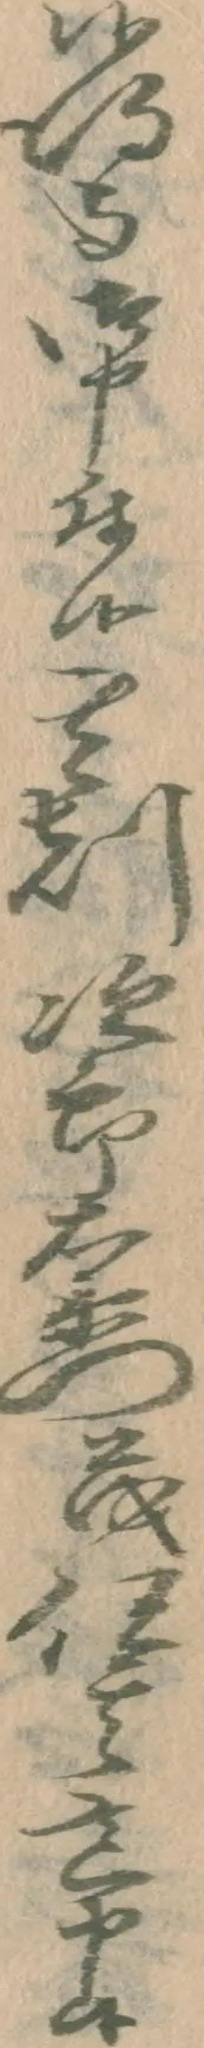候得与御申付候其刻次郎右衛門茂任其意申候
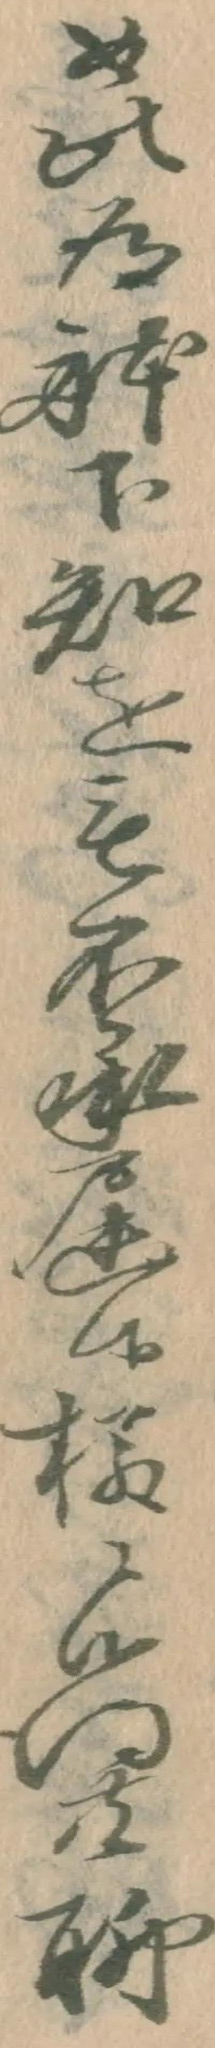如此為躰下知をも不承届候様に候得共聊
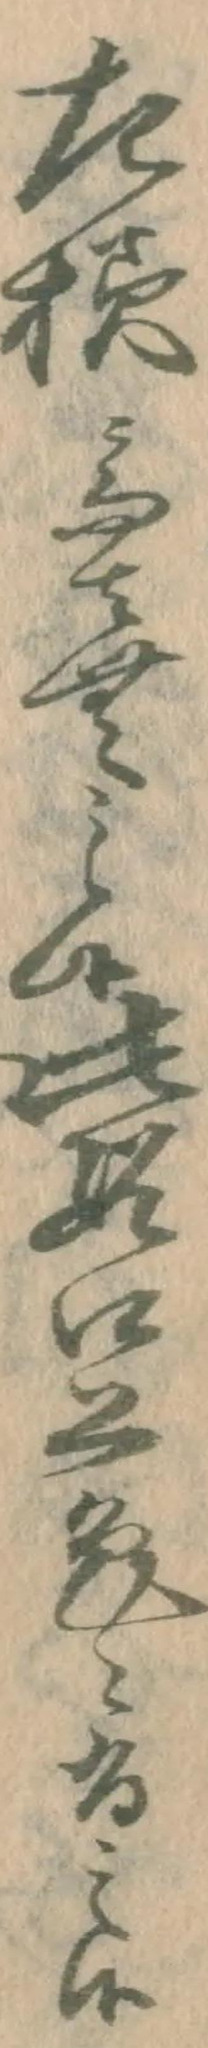左様に而者無之候此如口上色々有之候
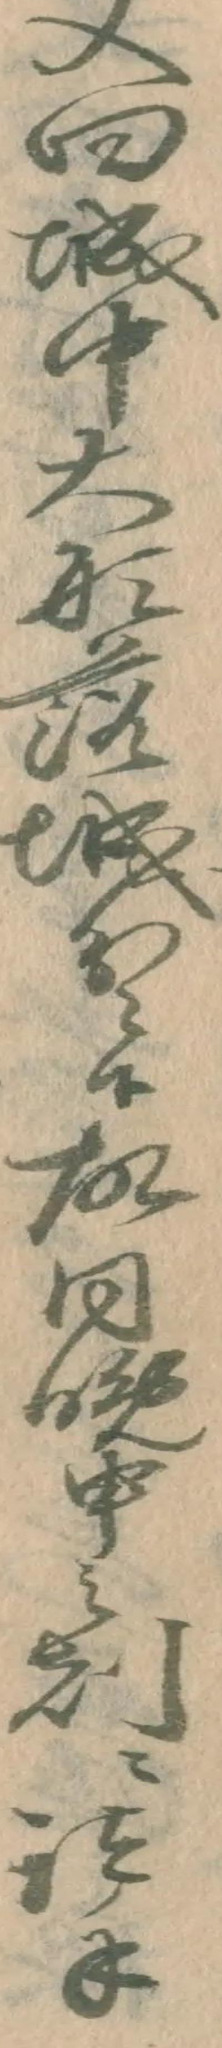又曰城中大形落城分に候故同晩申之刻に諸手
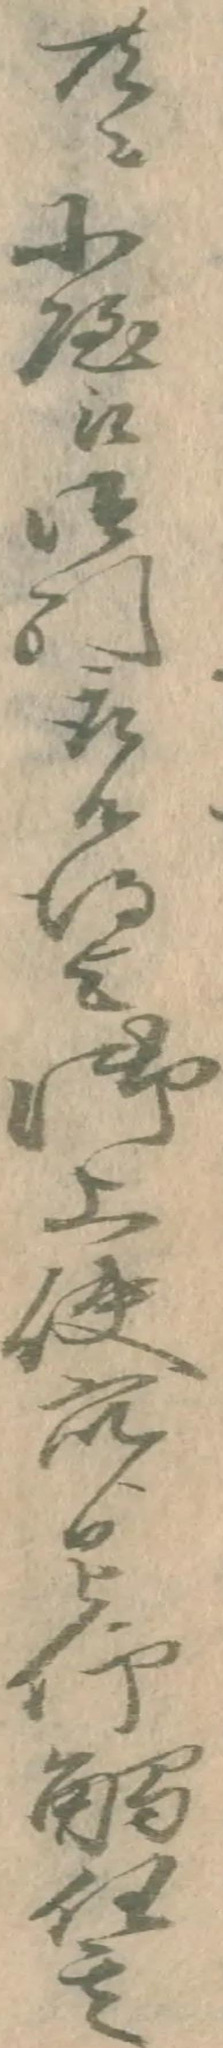共に小屋江御引取候得与御上使衆ゟ被仰触任其
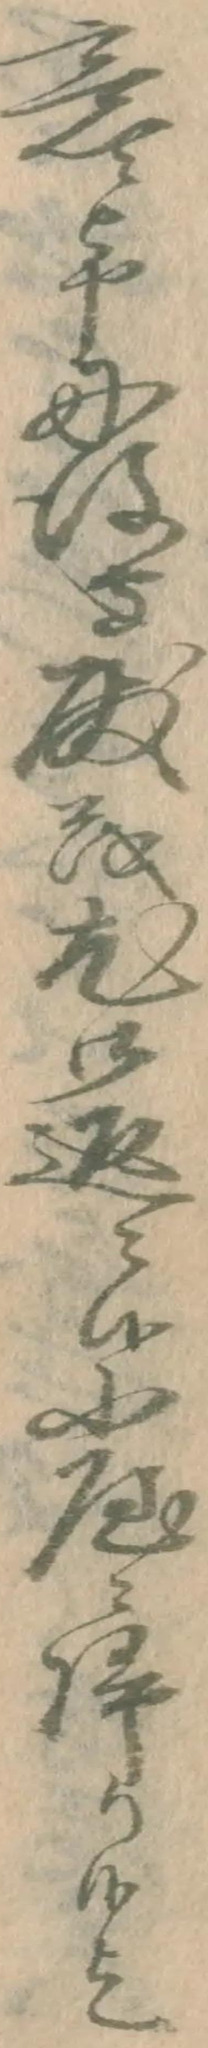意に被申丹後守殿茂尤御返に候小屋に帰り候与

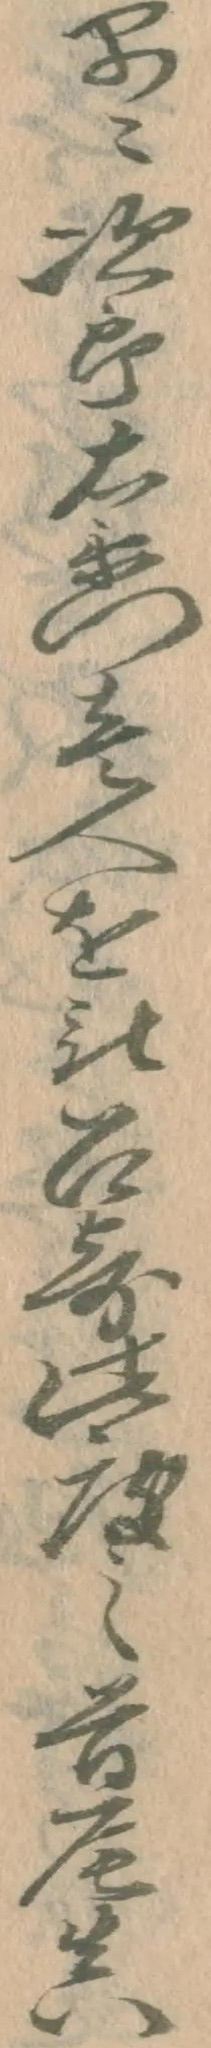早々次郎右衛門壱人を被召寄此度之首尾真
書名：切支丹御退治記 49巻. [8]
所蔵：国立国会図書館 National Diet Library, JAPAN
